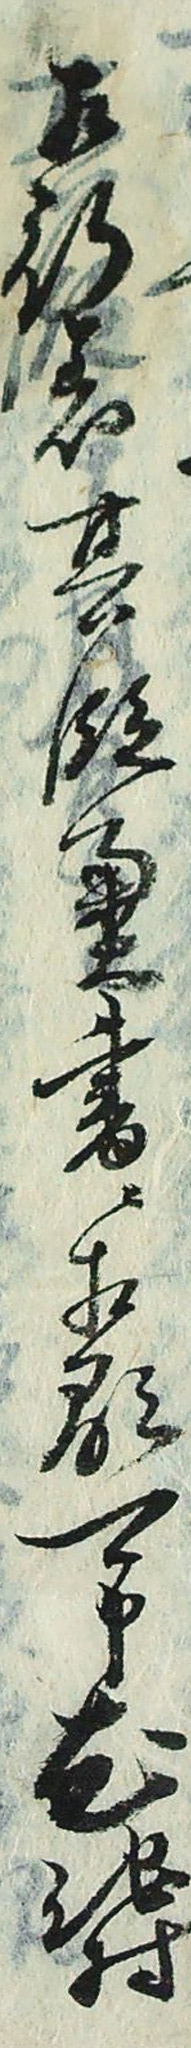相行着其段奥書ニ相顕可申尤他村
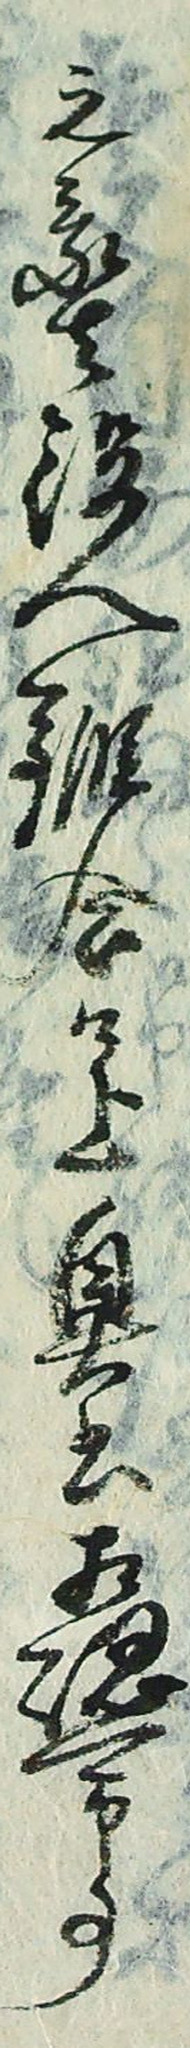之義者役人鍛合候上奥書相認可申事
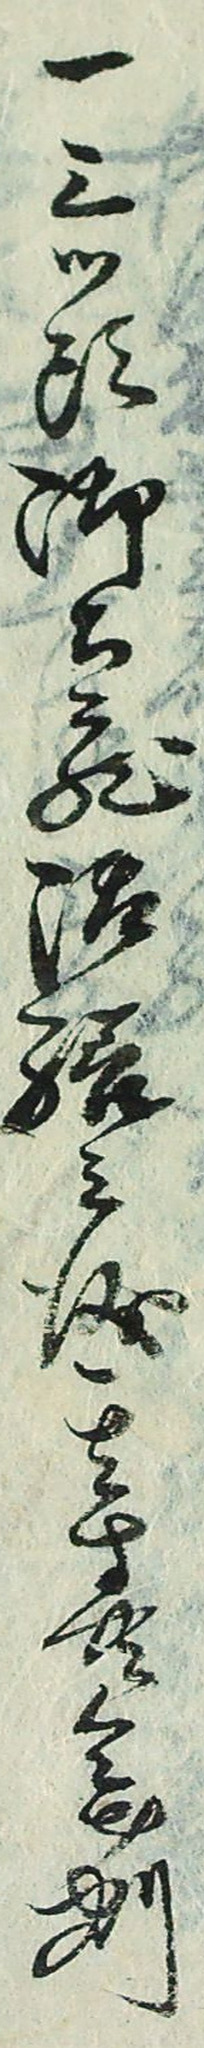一三ツ頭御土蔵御繕之儀其方共令才判
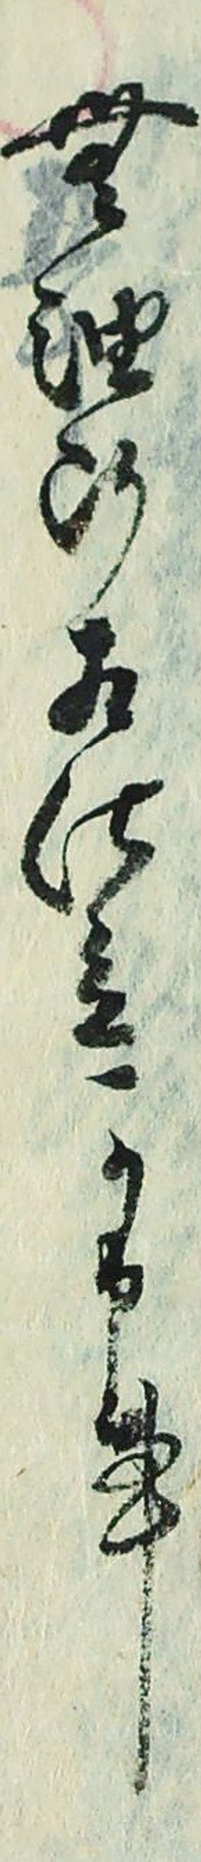無油断相仕立可申事
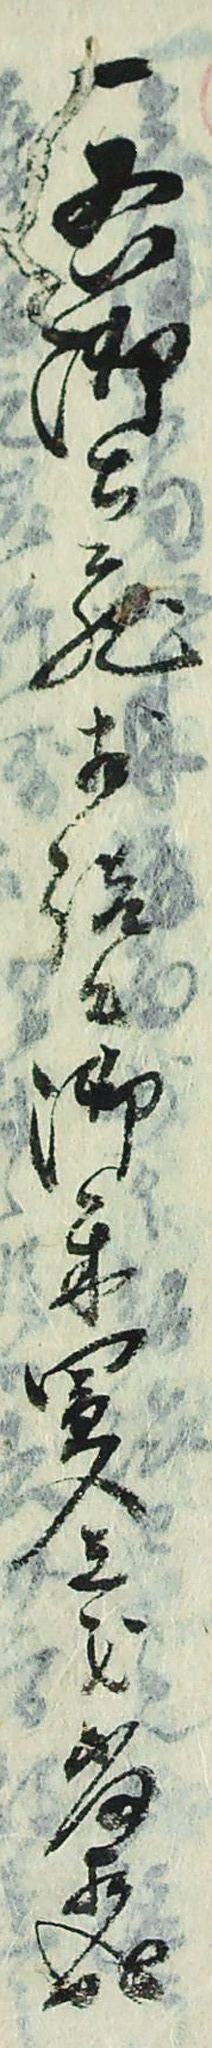一右御土蔵相詰候御米買入之義如何相成
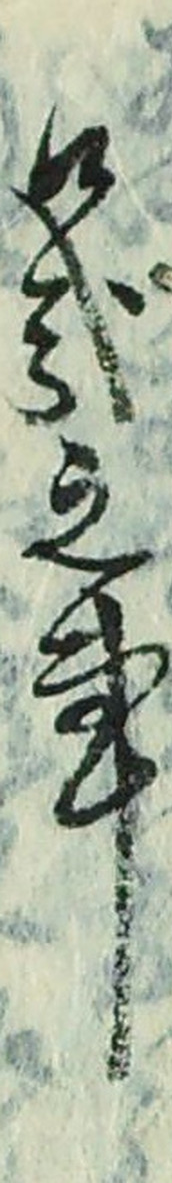候哉之事
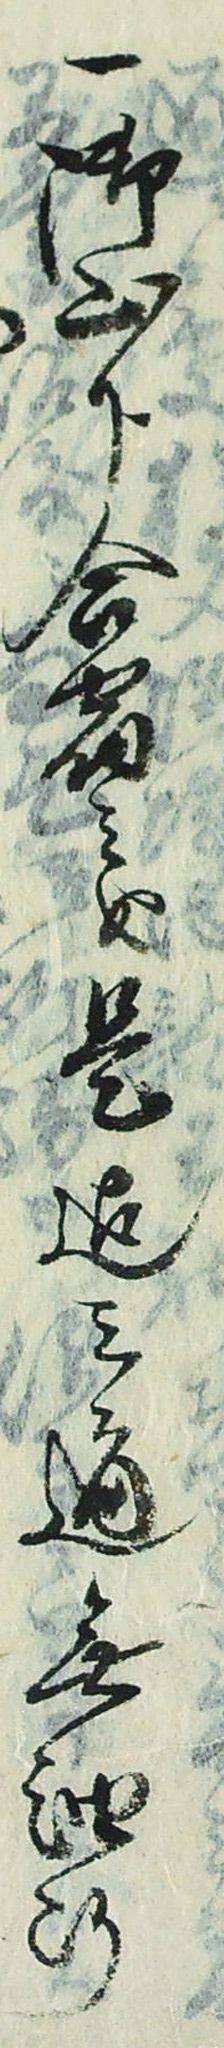一御山下合宿之義是迄之通無油断
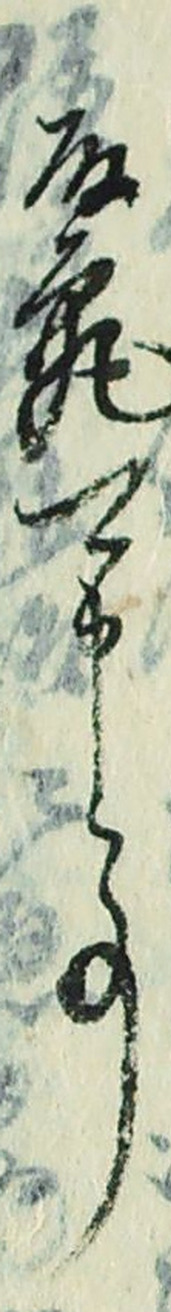取究可申事
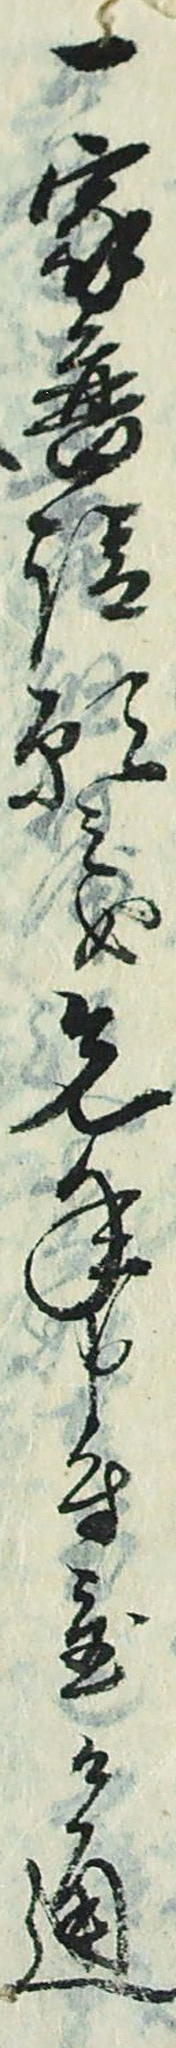一家普請願之義先年申付置候通
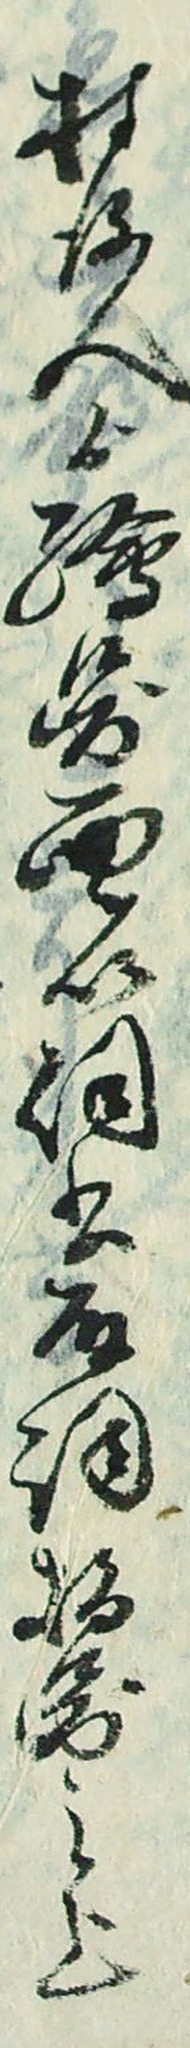村役人ゟ繪圖面ヲ以伺書取調指圖之上
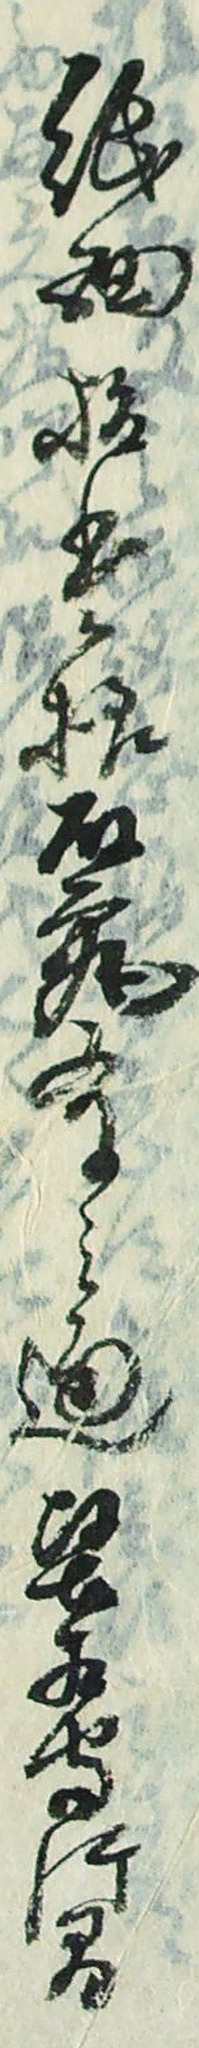紙面指出候様取究有之通堅相守片間

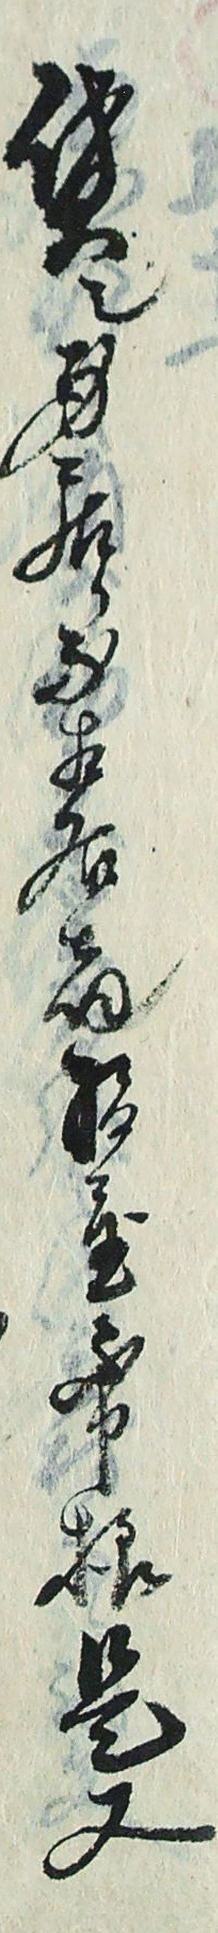貸シ身居り不相居者指置不申様是又
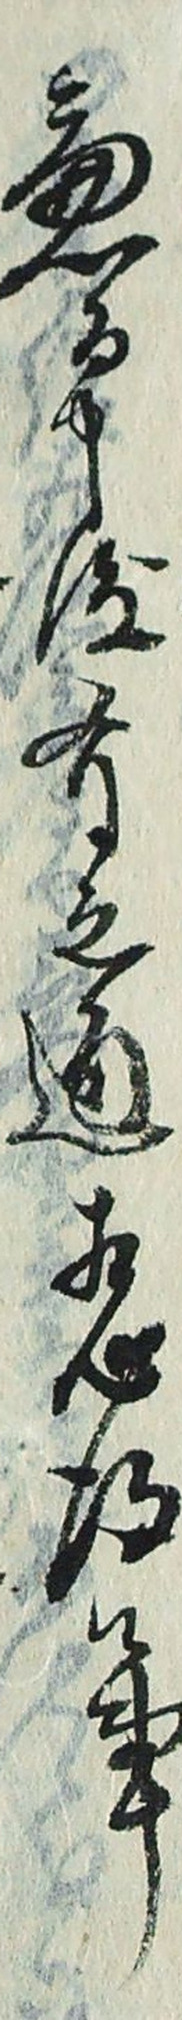兼而申渡有之通相心得候事
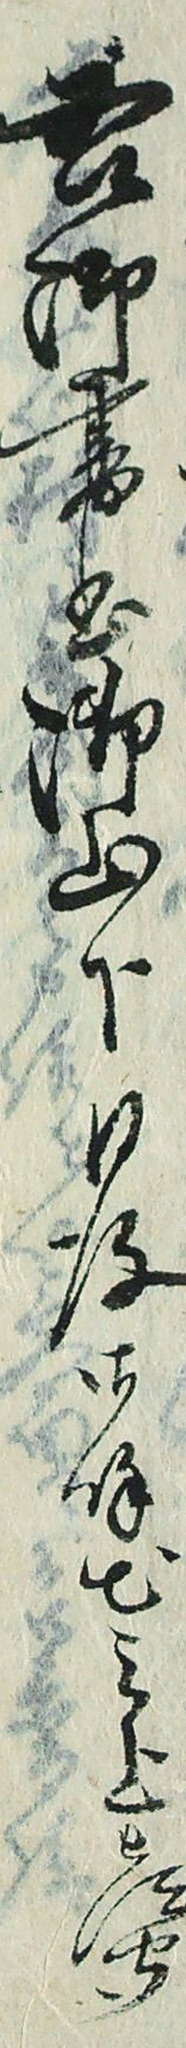右御書書御山下同役御呼出之上被仰聞
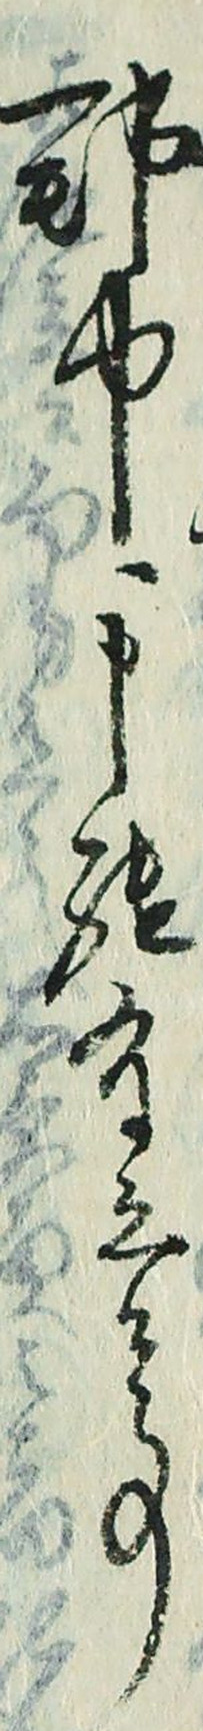郡中へ申継有之候事
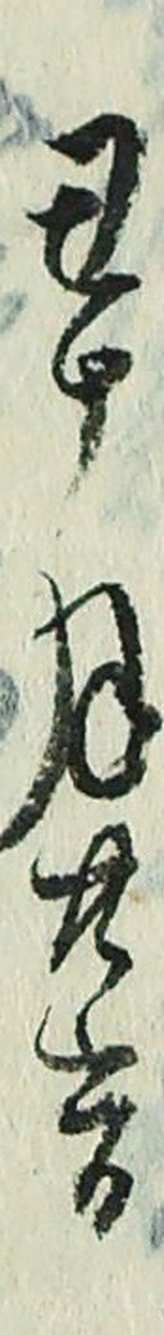丑十月廿六日
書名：諸御趣意書并御下知向之写
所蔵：鳴門教育大学 Naruto University of Education
